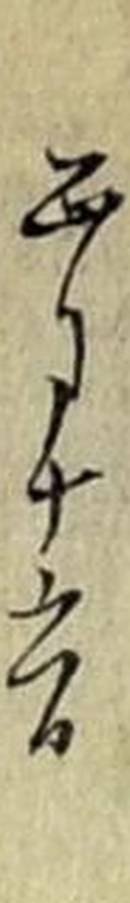正月十六日
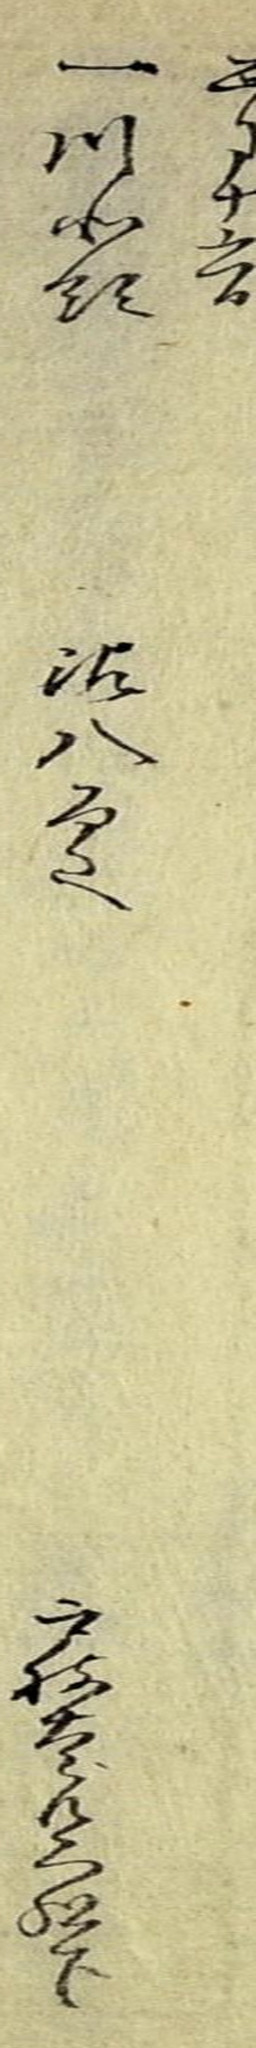一川北領銀八百匁戸枝太郎左衛門組下
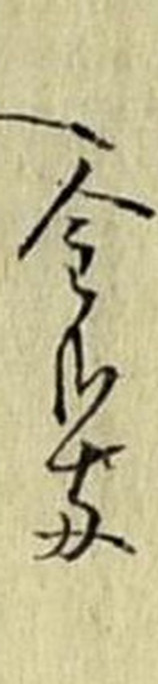金弐朱
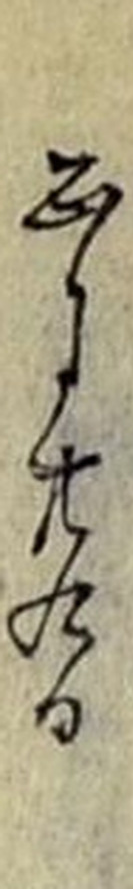正月廿九日
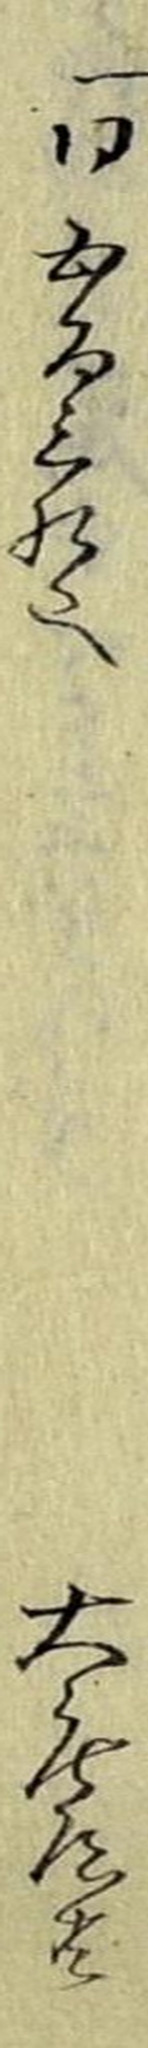同五百三拾匁大庄屋共
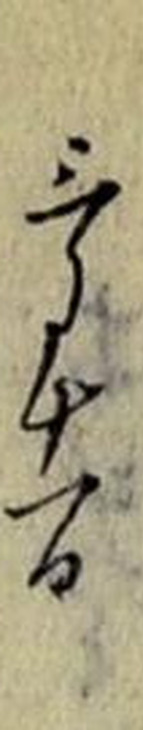三月十六日
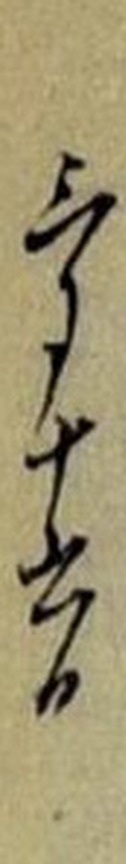三月十六日
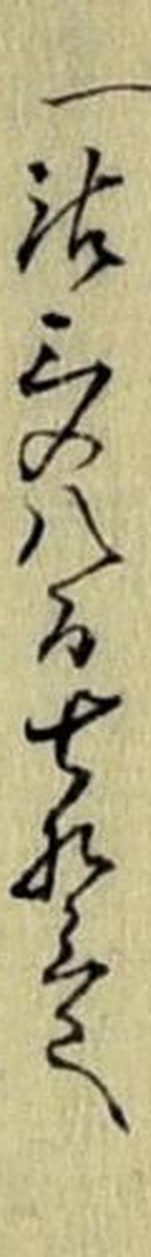銀八貫八百七拾四匁
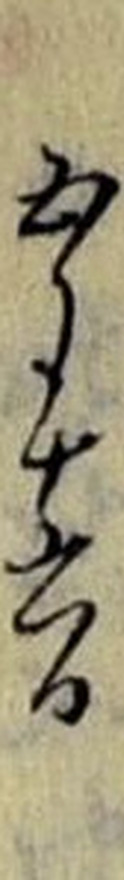五月十六日
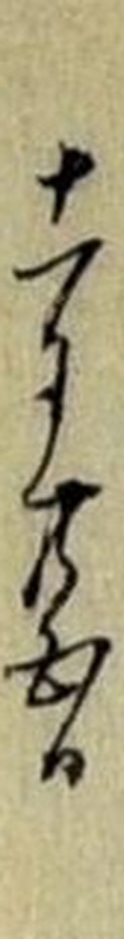十一月廿五日
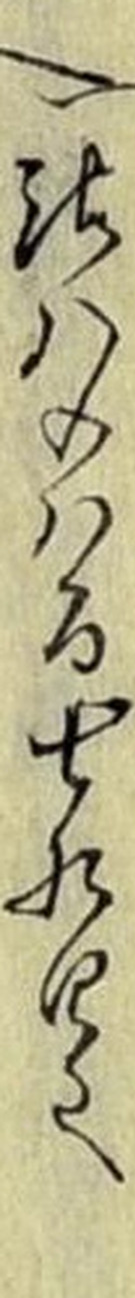銀八貫八百七拾四匁
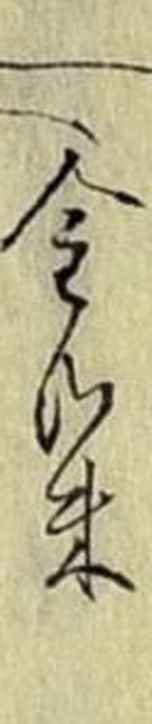金弐朱
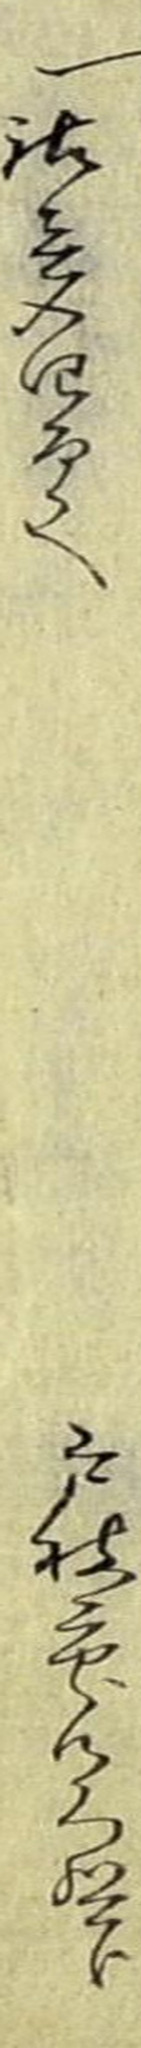銀壱貫四百匁戸枝市郎左衛門組下
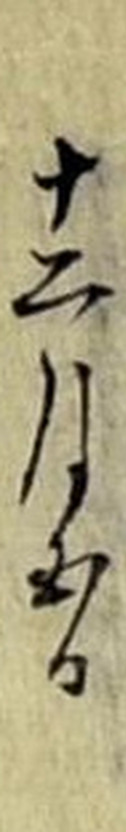十二月五日

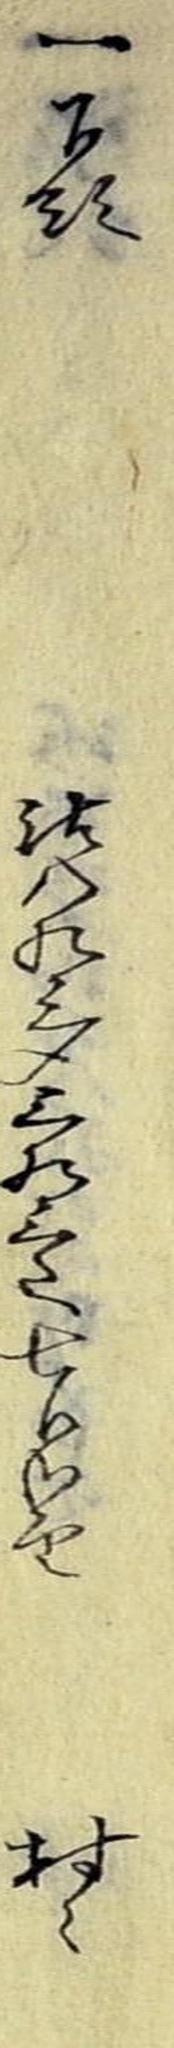一下領銀八拾三貫三拾三匁七分弐厘村々
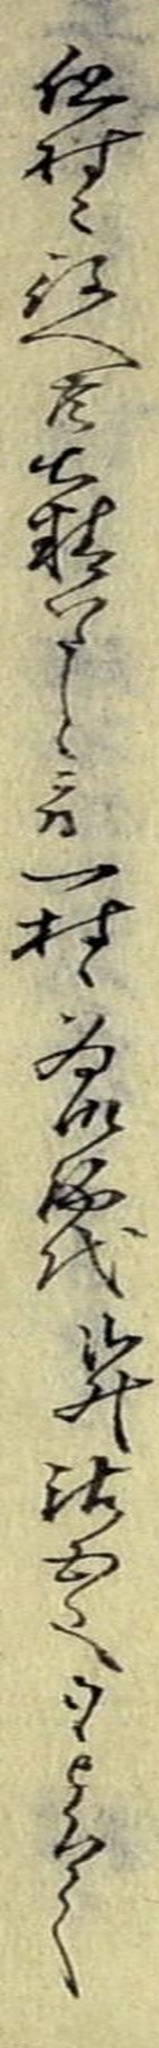但村々役人共出精いたし候に付一村へ為御酒代弐升銀五匁つヽ被下之
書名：命令之部 六
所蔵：福井県文書館 Fukui Prefectural Archives
